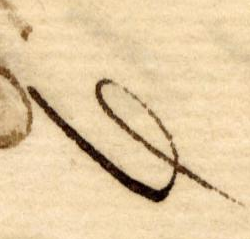6
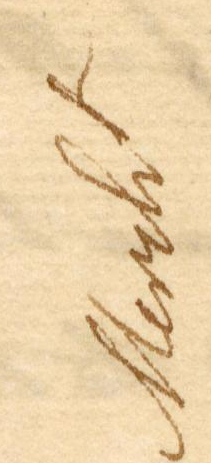Merch^t
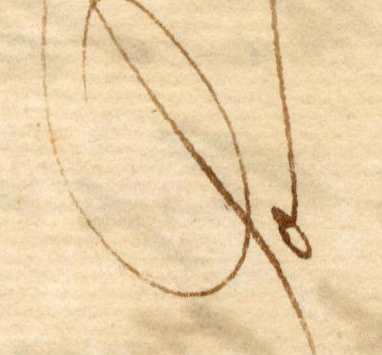To
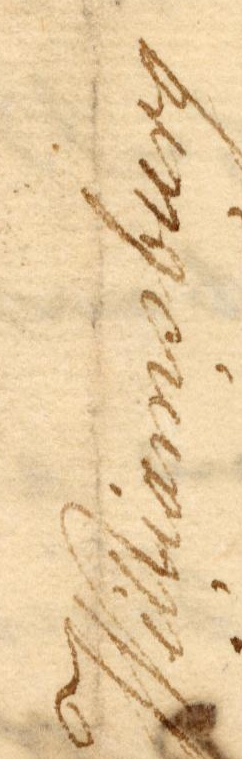Williamsburg
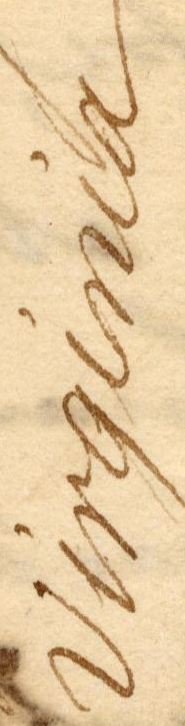Virginia
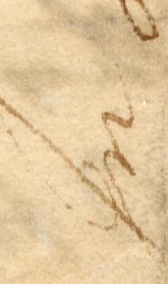In
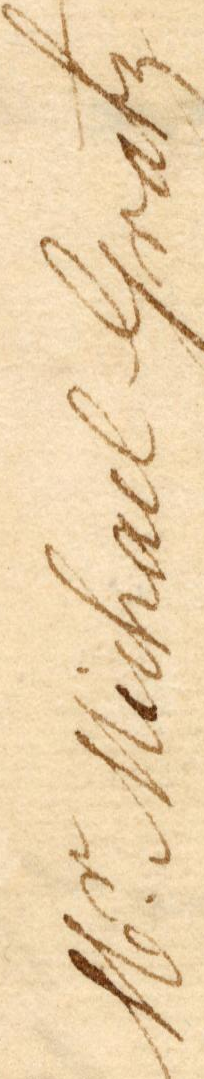M^r. Michael Gratz
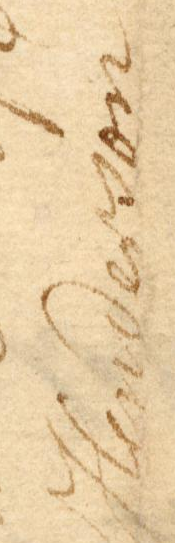Henderson
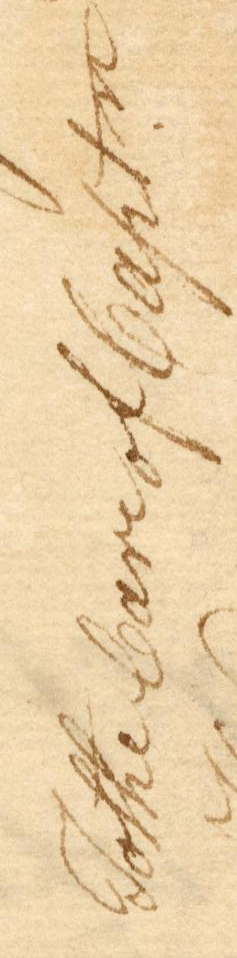To the Care of Capt^n.
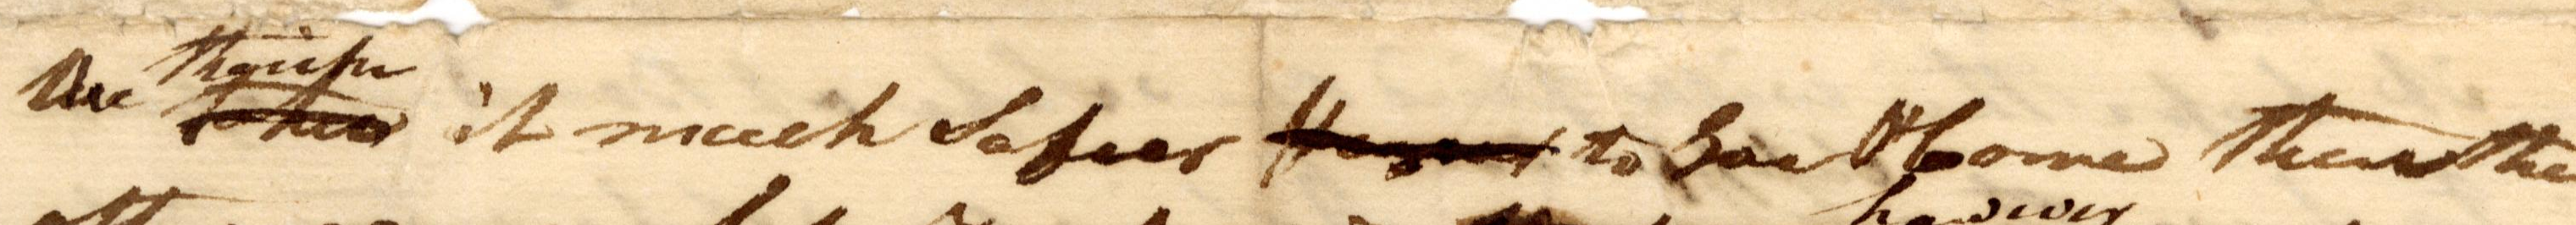Due thinke it much safer [____] to Goe & Come than the
